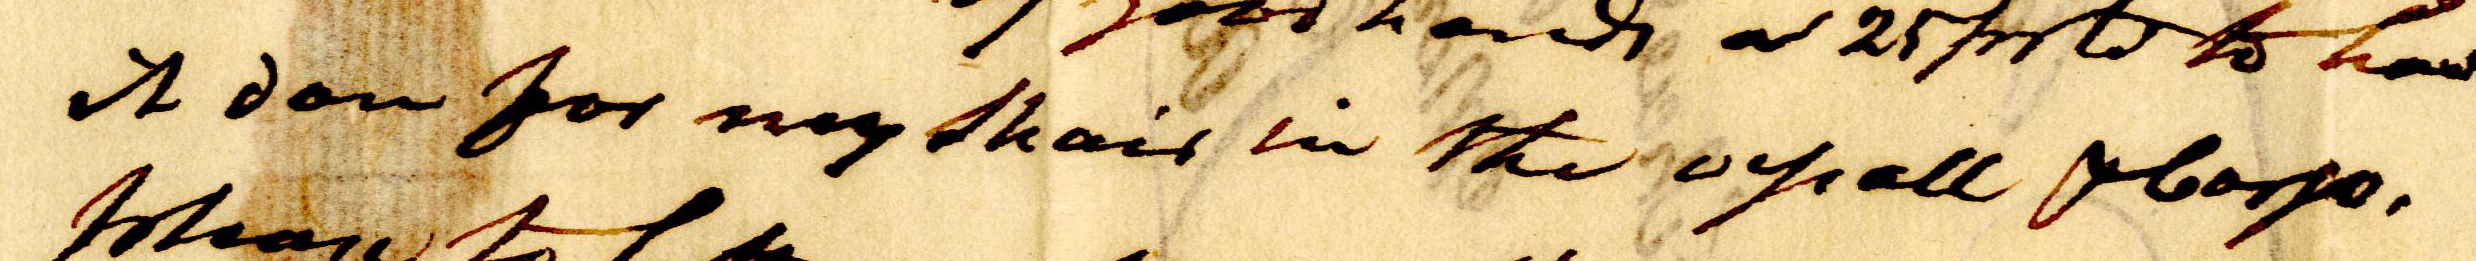it don for my shair in the vessall & cargo.
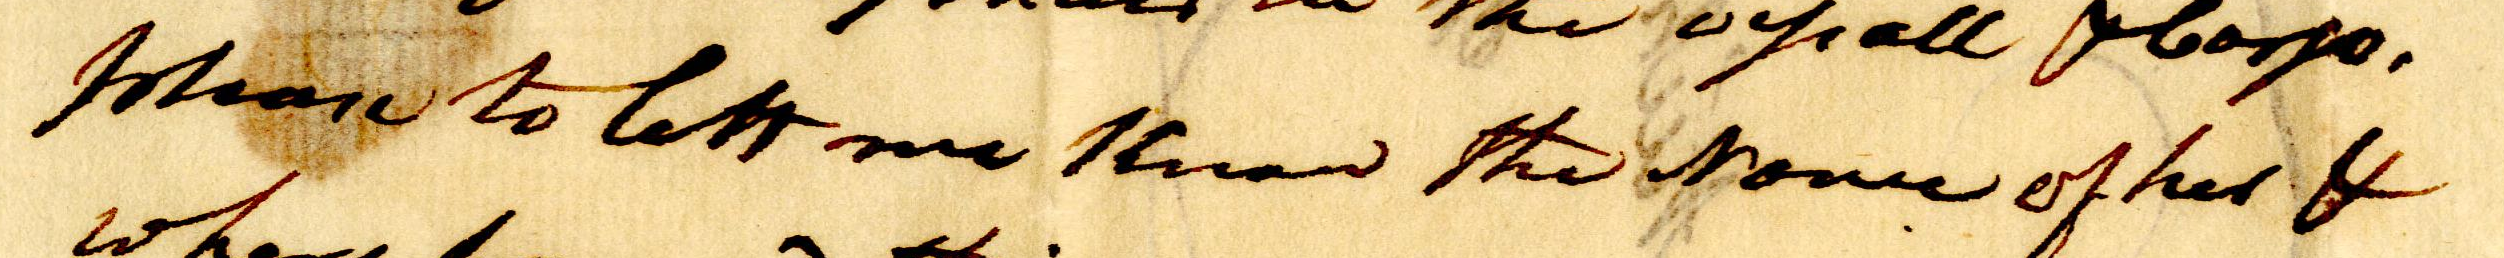Please to lett me know the name of her &
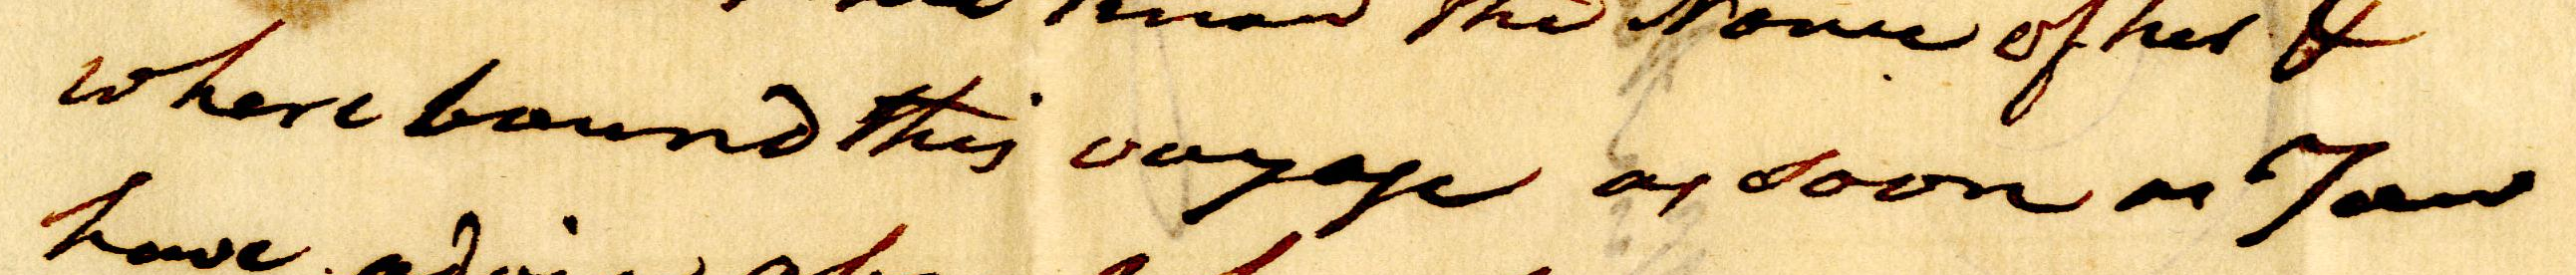where bound this voyage as soon as You
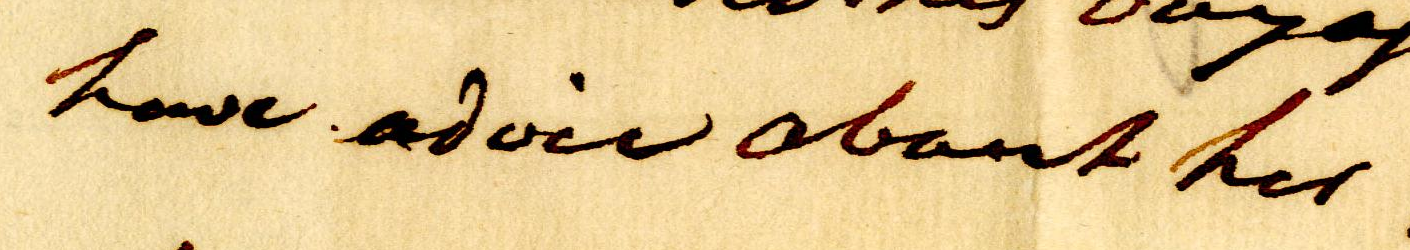have advice about her
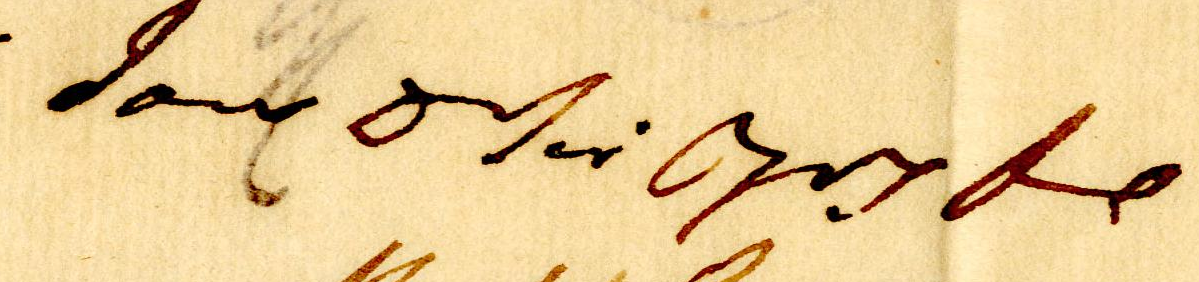I am D^r sir y^rs le
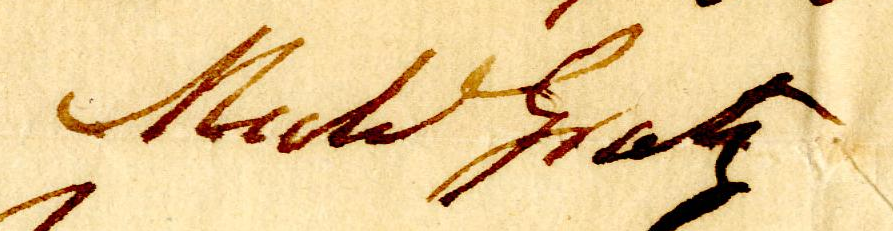Mich^l Gratz
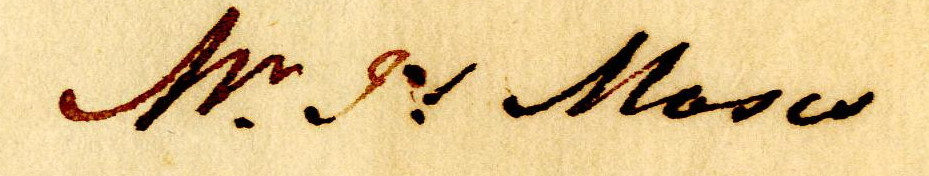M^r I^c Moses
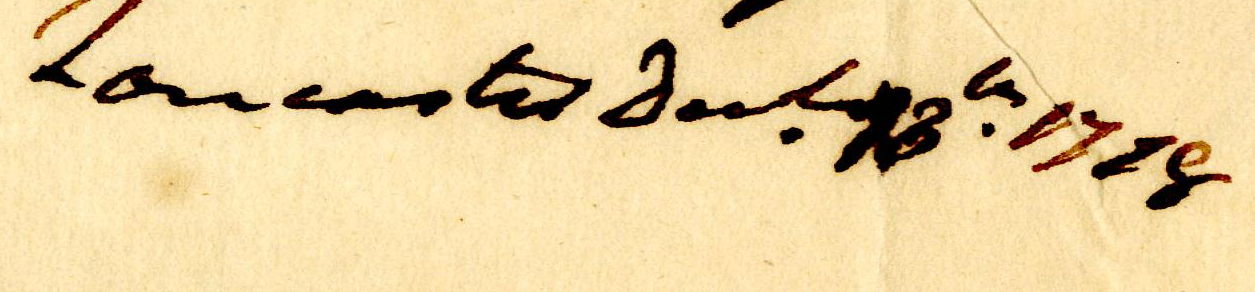Lancaster Dece^r 18^th 1778
